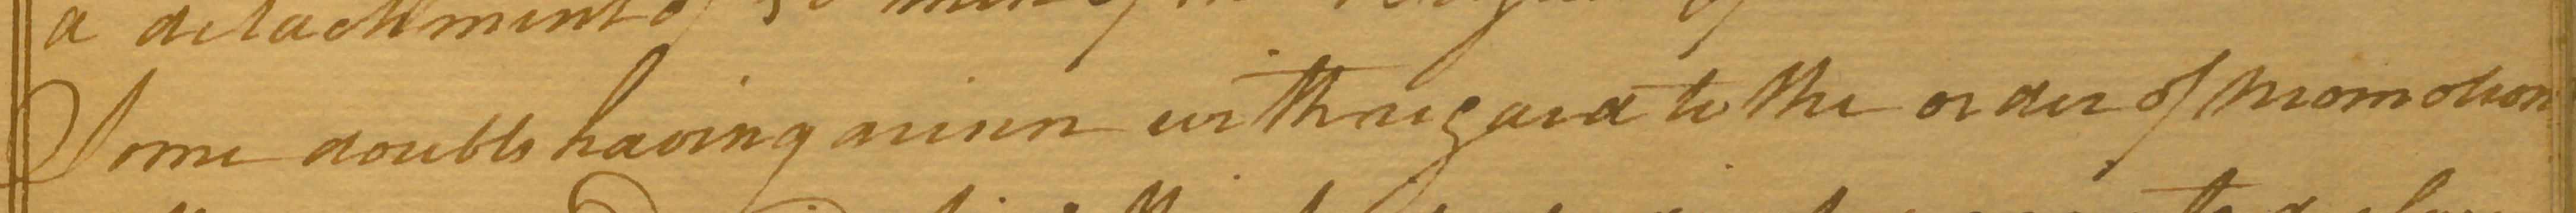Some doubts having arisen with regard to the order of promotion
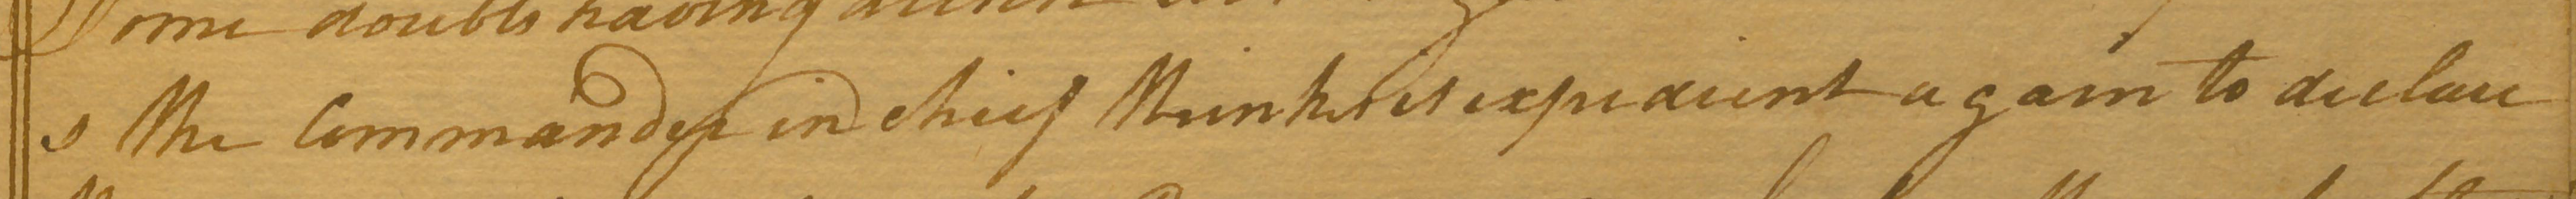s the Commander in chief thinks expedient again to declare
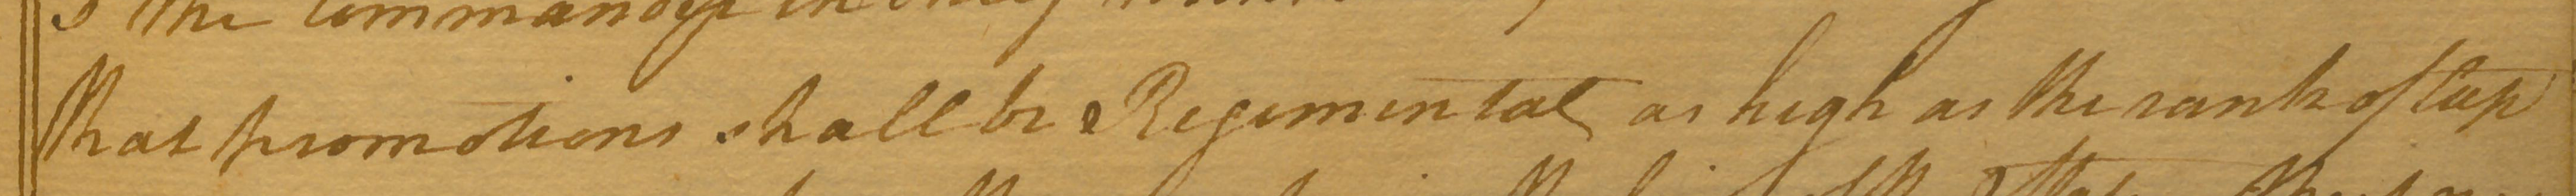that promotions shall be Regimental as high as the rank of Cap
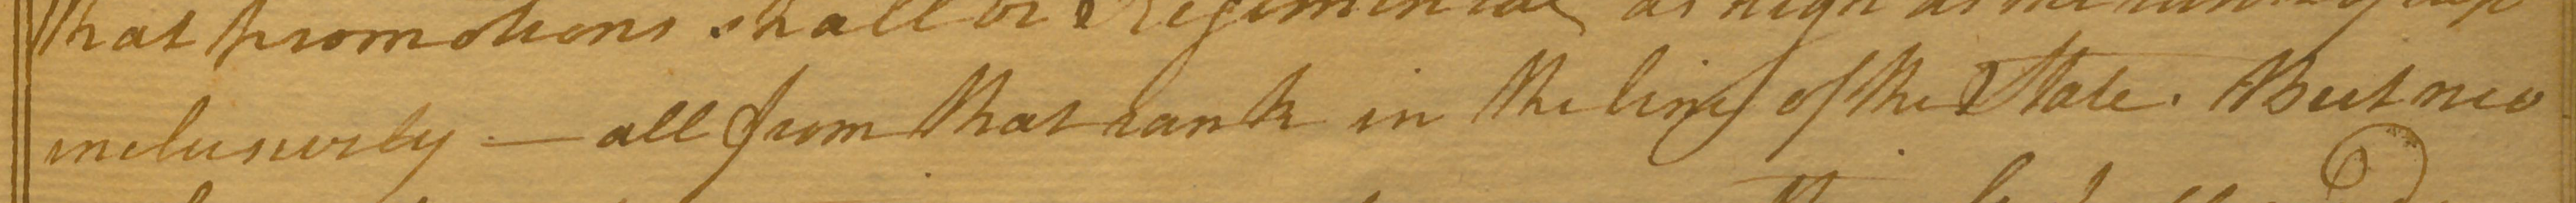inclusively- all from that rank in the line of the State. But nev
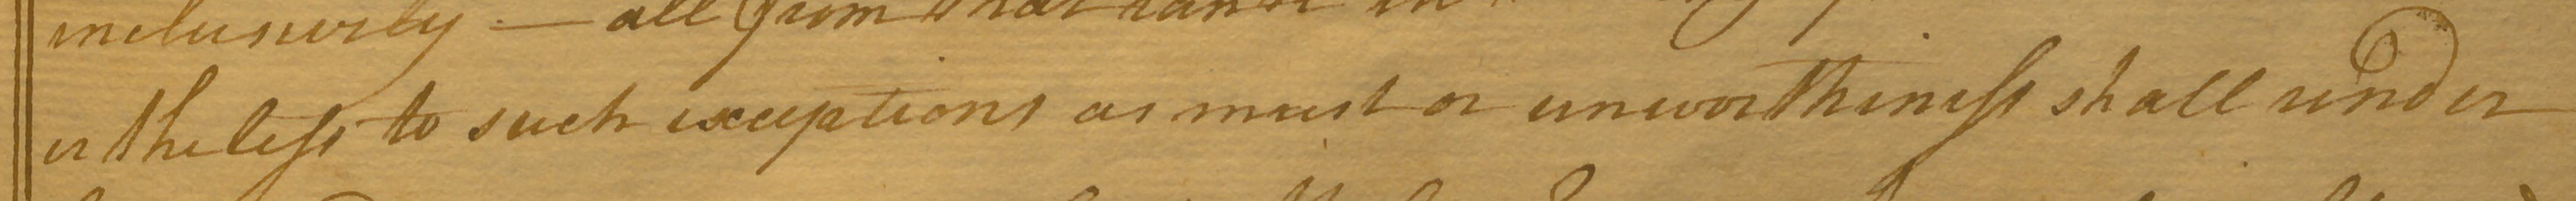ertheless to such exceptions as must or unworthiness shall under
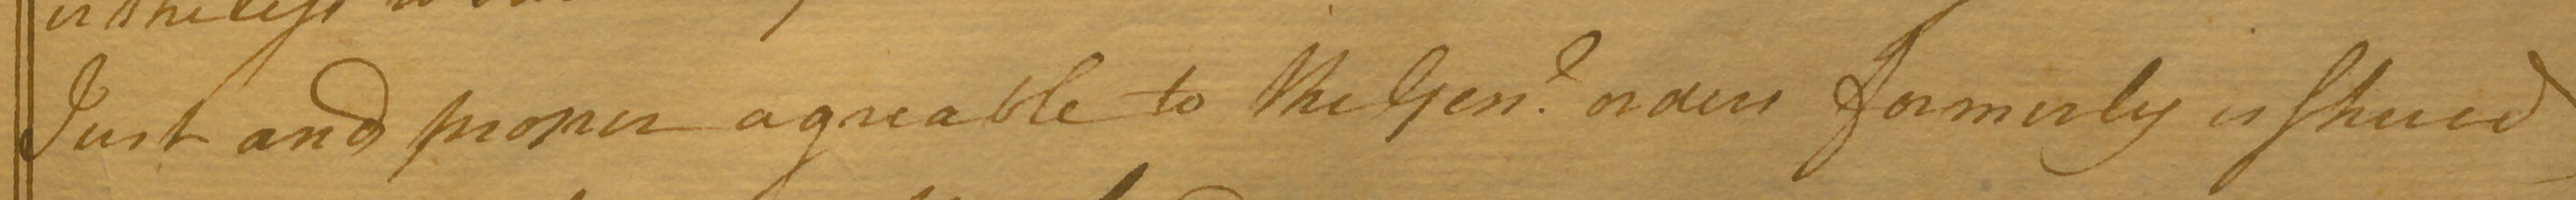Just and proper agreable to the Gen^l. orders formerly issued
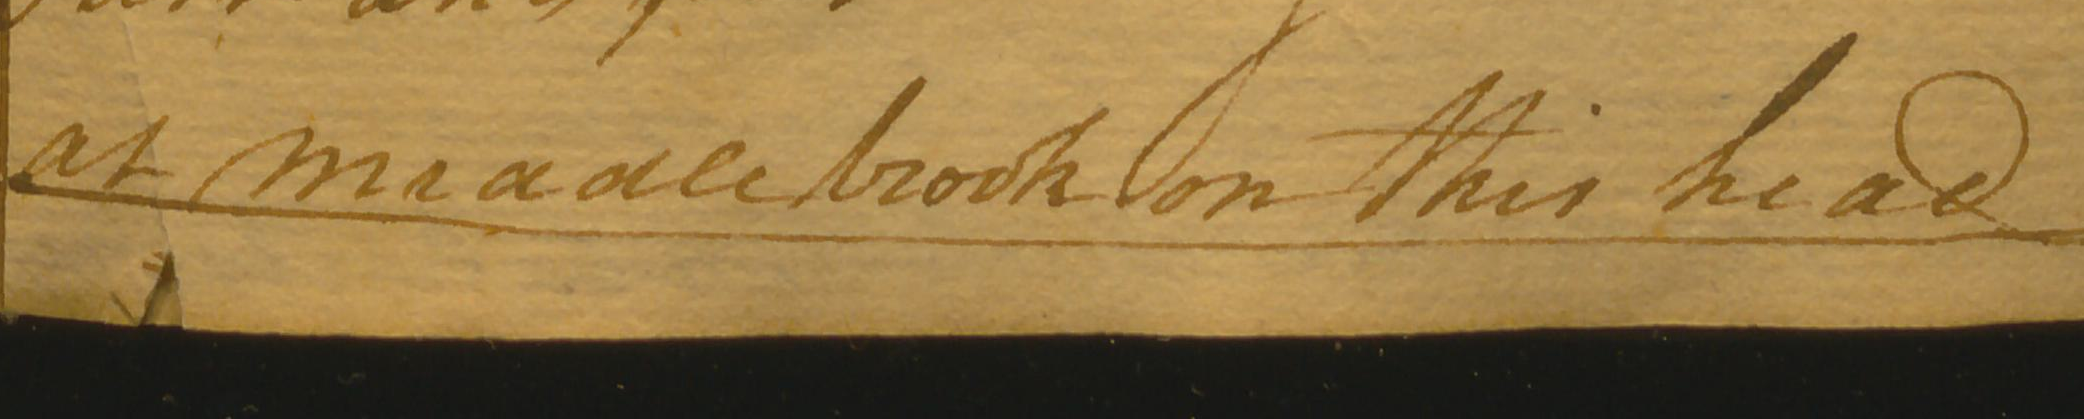at middlebrook on this head
